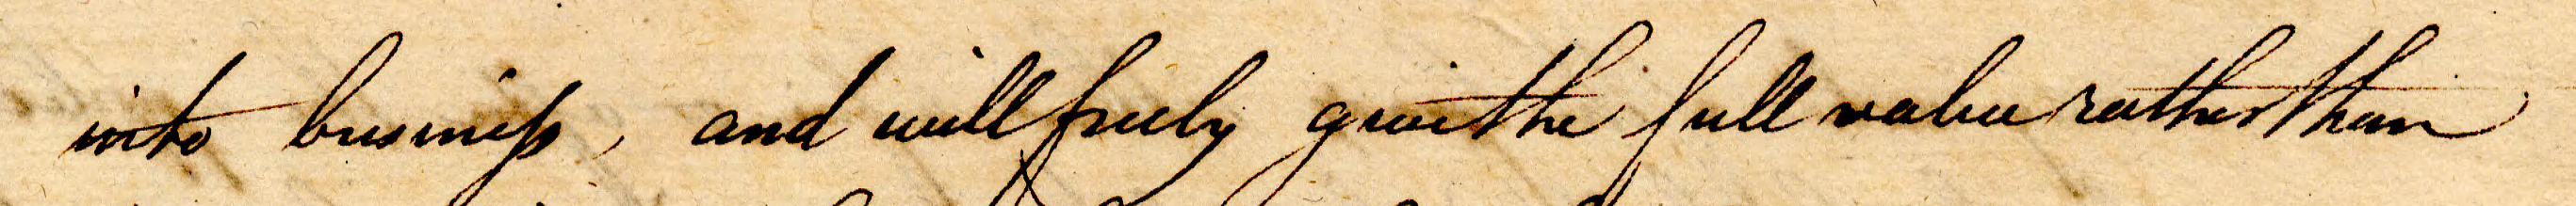into business, and will freely give the full value rather than
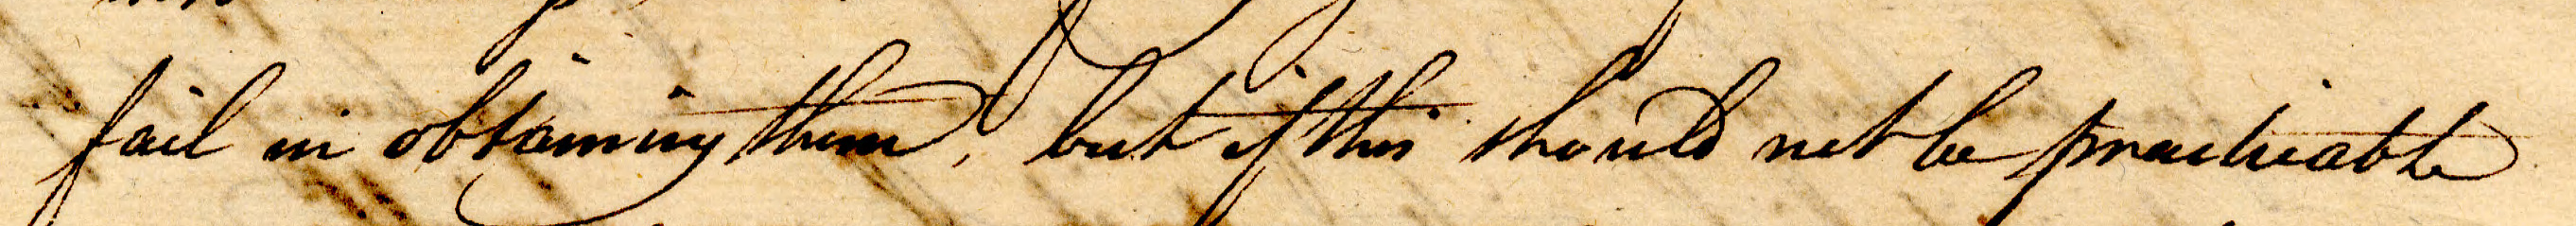fail in obtaining them, but if this should not be practicable
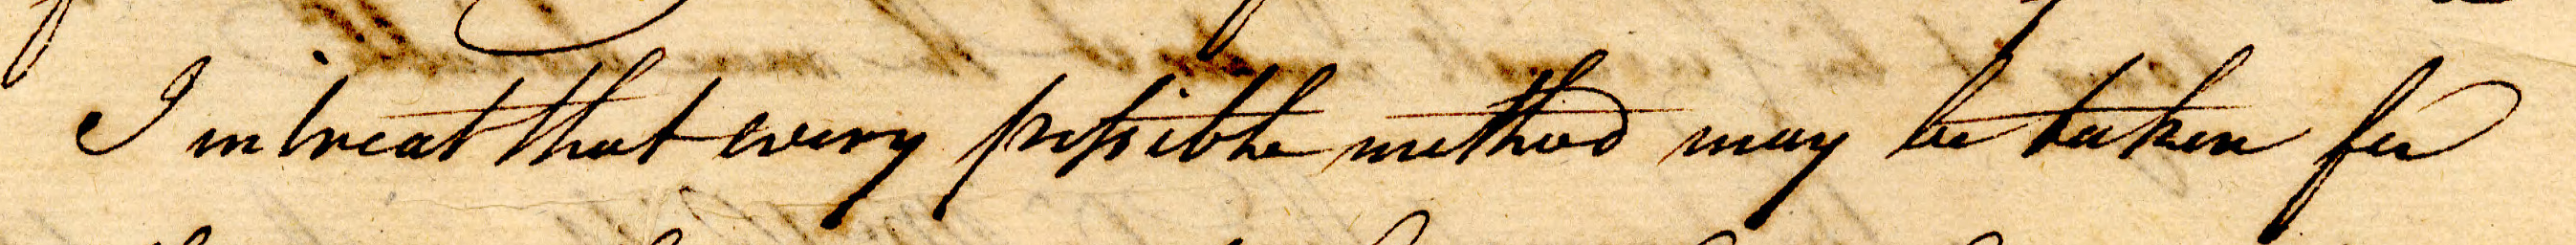I intreat that every possible method may be taken for
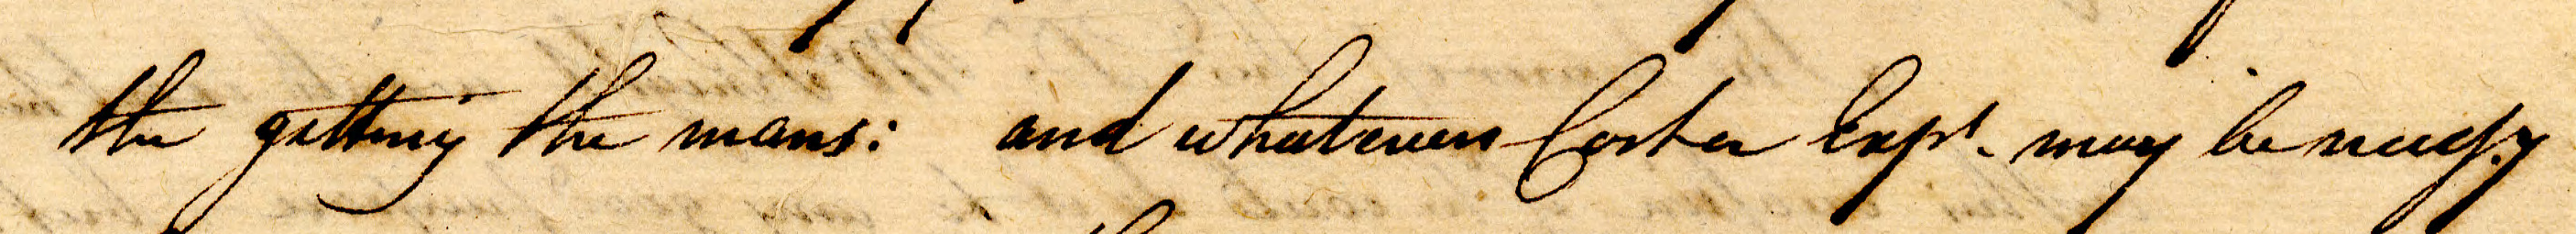the getting the mans: and whatever Cost or Exp^s. may be neces.y
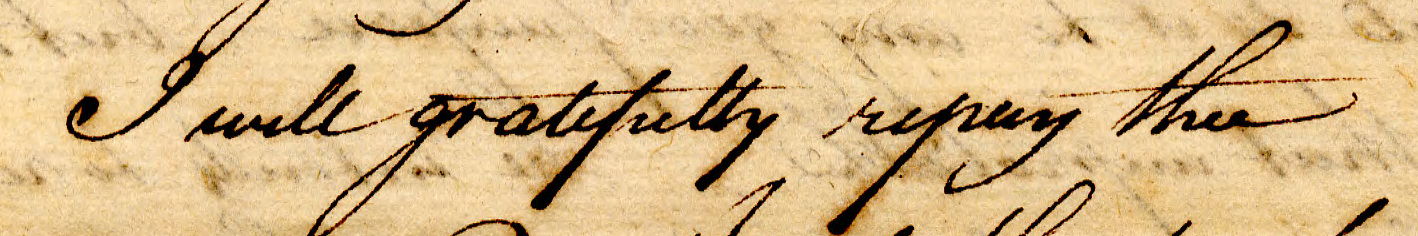I will gratefully repay thee
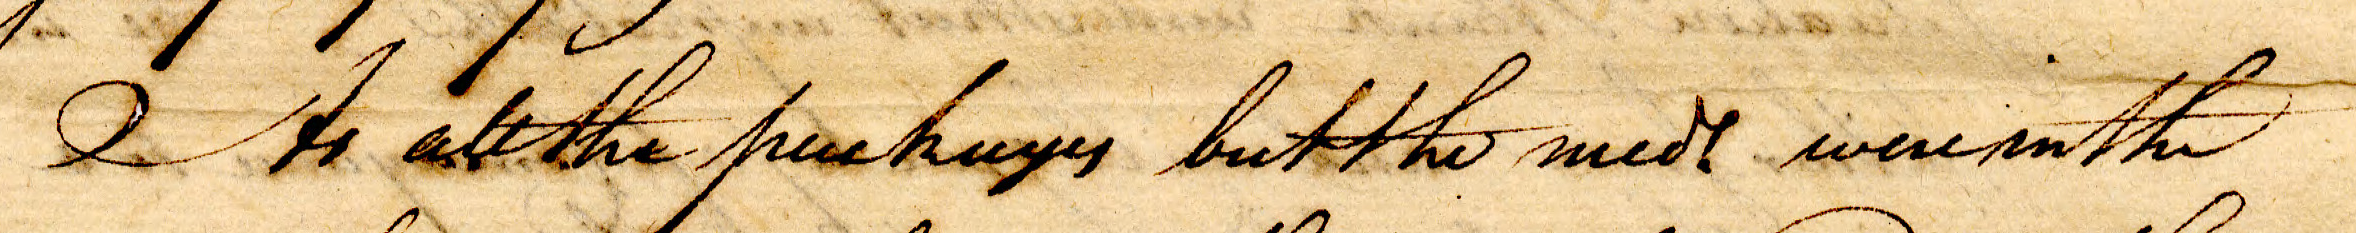As all the packages but the med^s. were in the
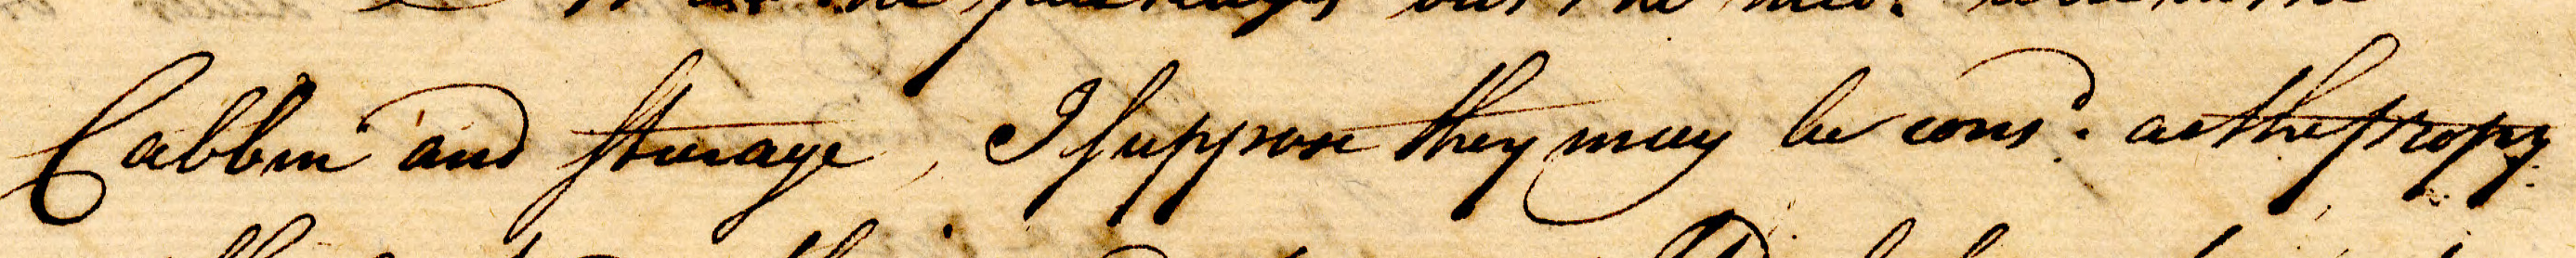Cabbin and Storage, I suppose they may be cons^d. as the prop^y
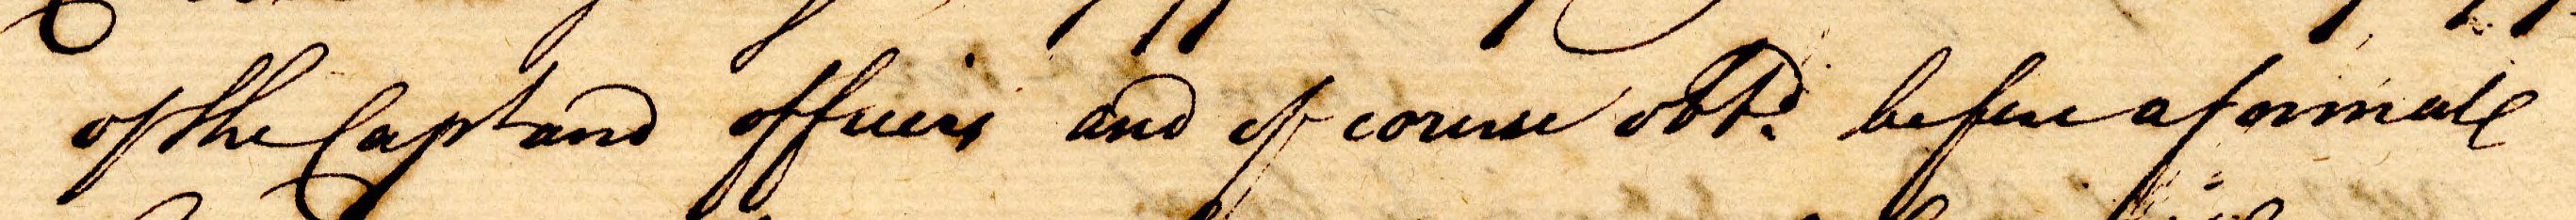of the Cap^t and officers and of course obt^d. before a formall
